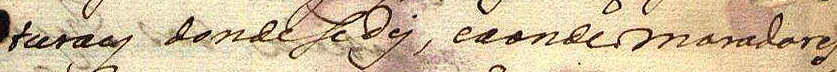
turaes donde se dis, e aonde moradores
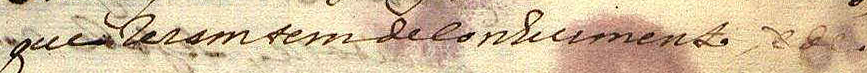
que Rezam tem de conhecimento, e de
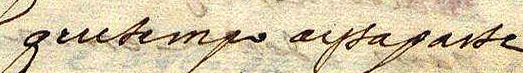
que tempo a esta parte
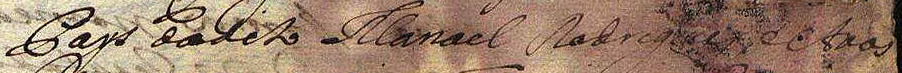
Pays do dito Manoel Rodrigues e Avos
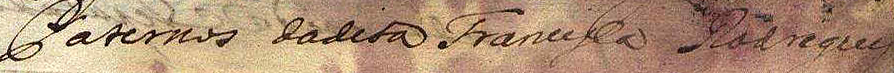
Paternos da dita Francisca Rodrigues
